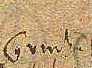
q̄ vinha
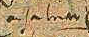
a saluar
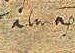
almas.
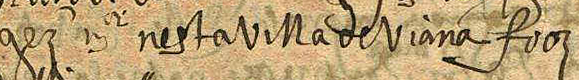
gez̄ mor nesta Villa de Viana fooz
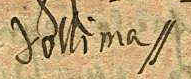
do llima //
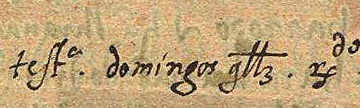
testa. domingo gl̄lz. rꝭdo.
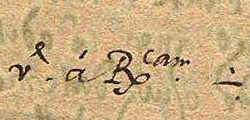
ve. a Rꝭçam
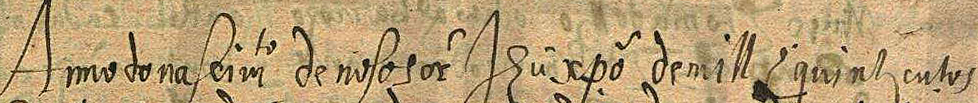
Anno do nascimto de noso sor̄ Jhū xpō de mill E quinhentos
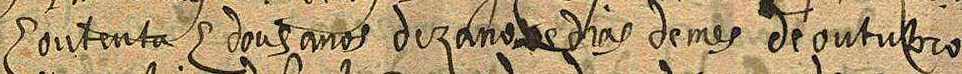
E outenta E dous anos dezanove dias de mes de outubro
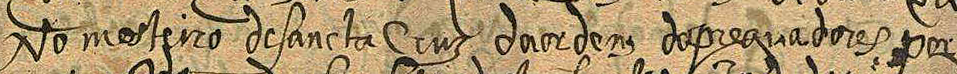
No mosteiro de sancta Cruz da ordem de preguadores per
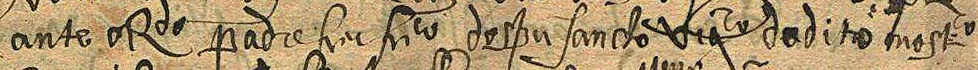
ante o Rdo padre frco do spu sancto vigro do dito mostro
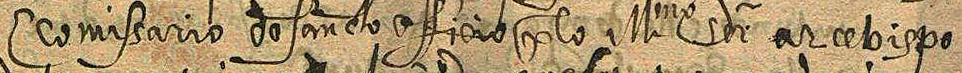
E comissario do sancto officio p̄lo illmo sor̄ arcebispo
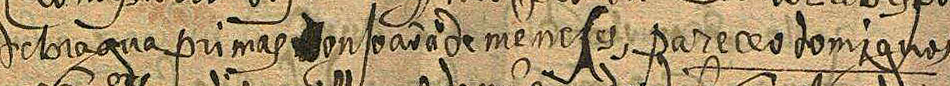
de bragua primas Don João de meneses, pareceo domjguos
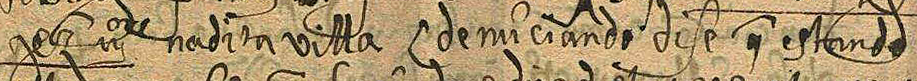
gez̄ mor na dita villa E denūciando dise q̄ estando
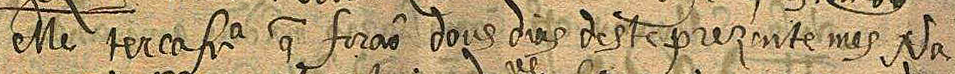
elle terça fra q̄ forão dous dias deste prezente mes Na
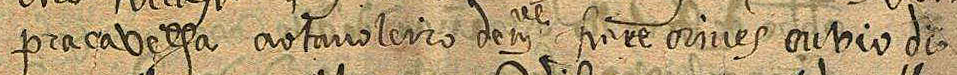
praça velha ao tauoleiro de mel frere oriues ouvio di
